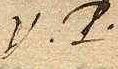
V.P.
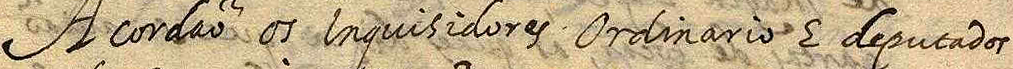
Acordaõ os inquisidores Ordinario e deputados
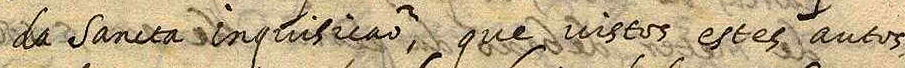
da Sancta inquisicaõ, que vistos estes autos
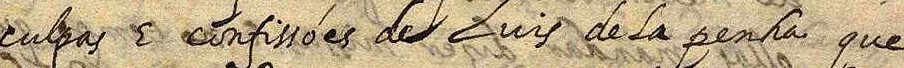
culpas e confissões de Luis de la penha que
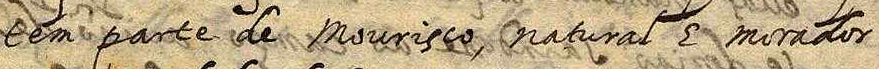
tem parte de mourisco, natural e morador
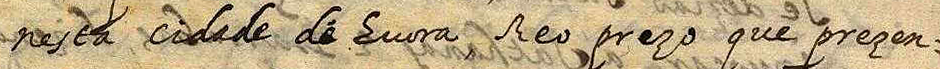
nesta cidade de Euora, Reo prezo que prezen
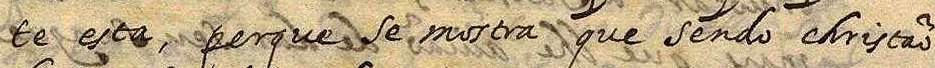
te esta, perque se mostra que sendo christaõ
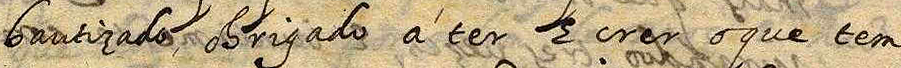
bautizado, obrigado a ter e crer o que tem
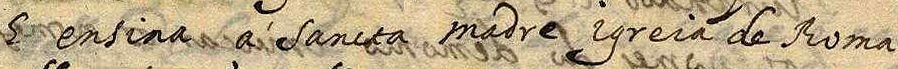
e ensina á Sancta madre igreia de Roma
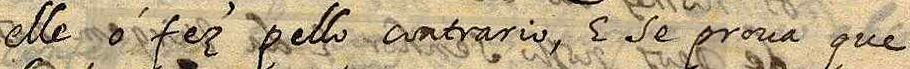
elle o fez pello contrario, e se proua que
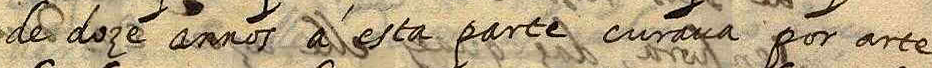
de doze annos á esta parte curaua por arte
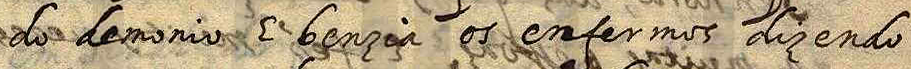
do demonio e benzia os enfermos dizendo
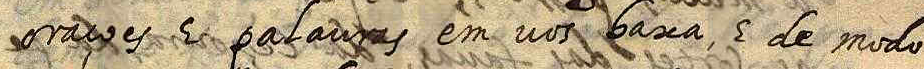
oraçoes e palauras em uos baxa, e de modo
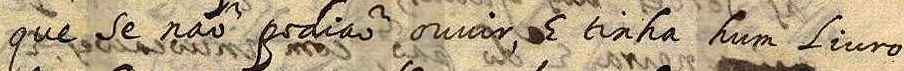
que se naõ podiaõ ouuir, e tinha hum Liuro
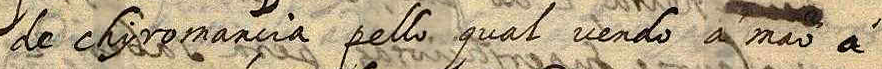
de chyromancia pello qual uendo à maõ á
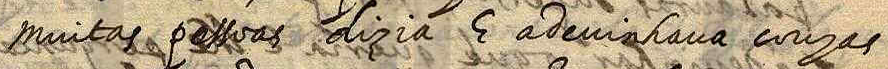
muitas pessoas dizia e adeuinhava couzas
